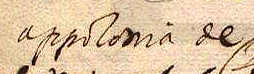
appolonia de
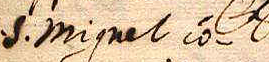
s. miguel cō
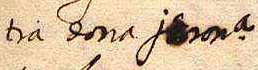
tra dona jeron.a
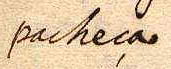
pacheca
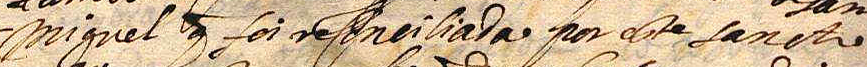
Miguel q̄ foi reConciliada por este sancto
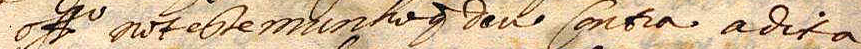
offo no testemunho q̄ deu Contra a dita
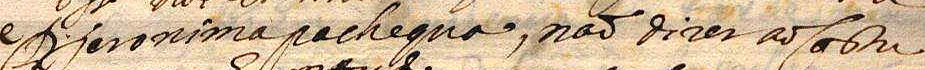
D. Jeronima pachequa, naõ dizer ao Costu
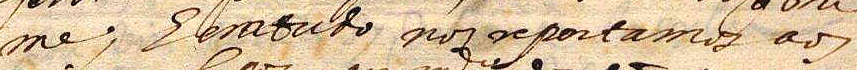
me, E em tudo nos reportamos aos
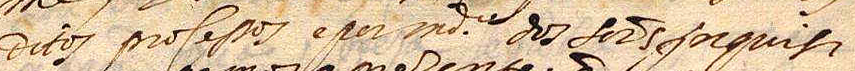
ditos proCessos e por md.o dos sor̄s jnquisi
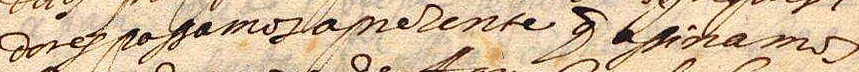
dores passamos a prezente q̄ assinamos
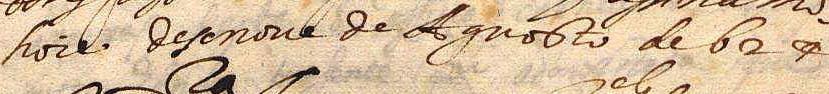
hoie. desenoue de Aguosto de 624
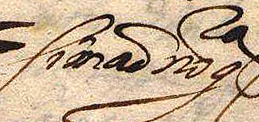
Simão nogra
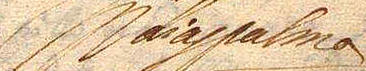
mel dias palma
